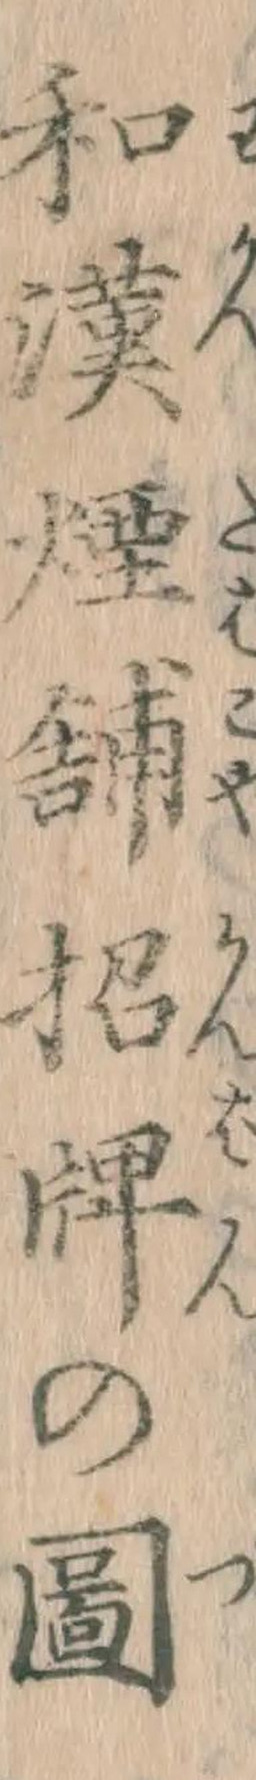和漢煙舗招牌の図
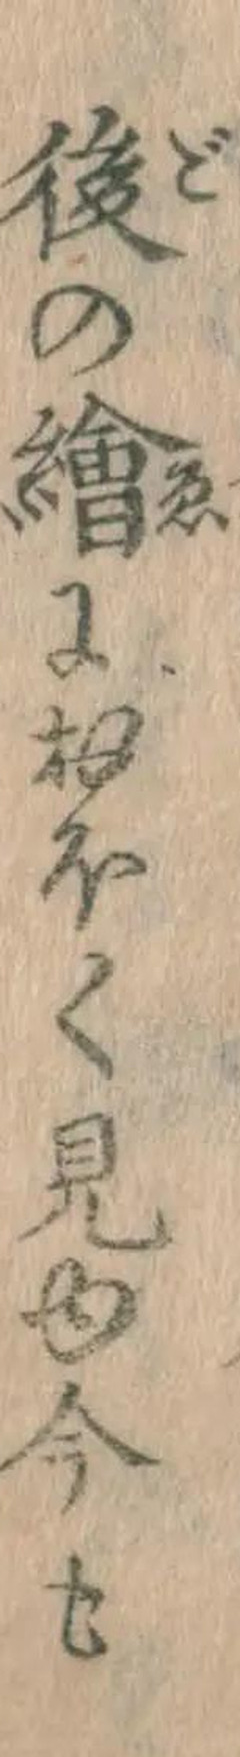後の絵におほく見ゆ今も
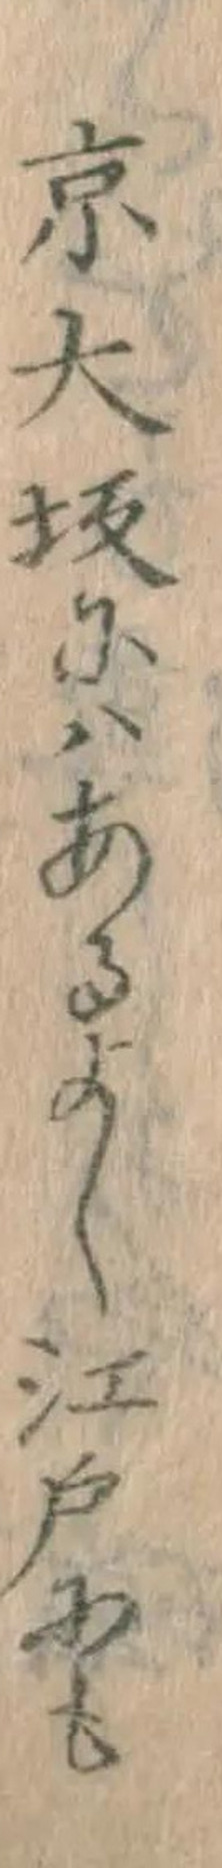京大坂にはあるよし江戸にも
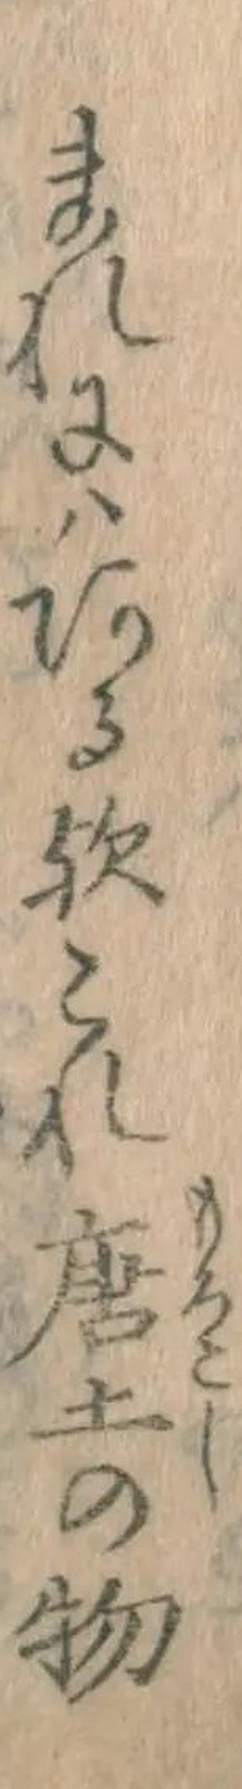まれにはある歟これ唐土の物
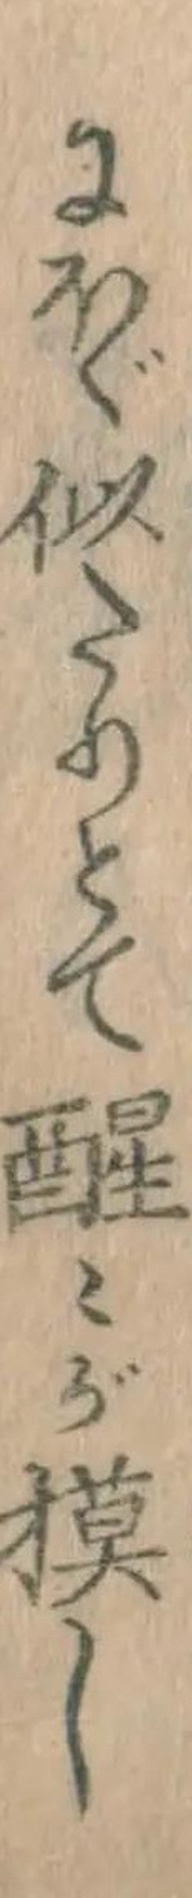にほゞ似たりとて醒々が摸し
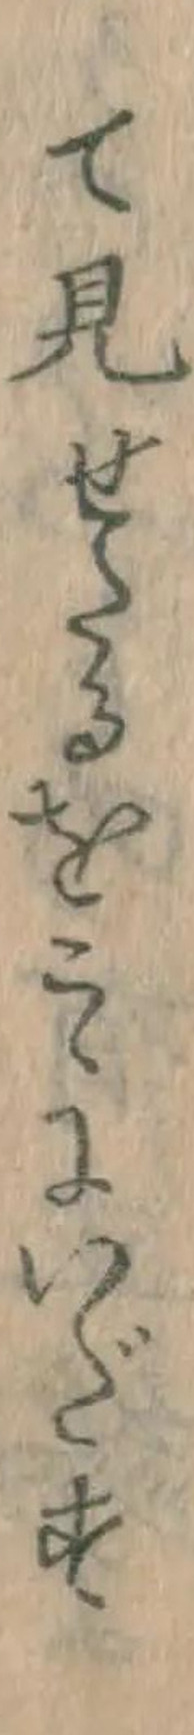て見せたるをこゝにいだす

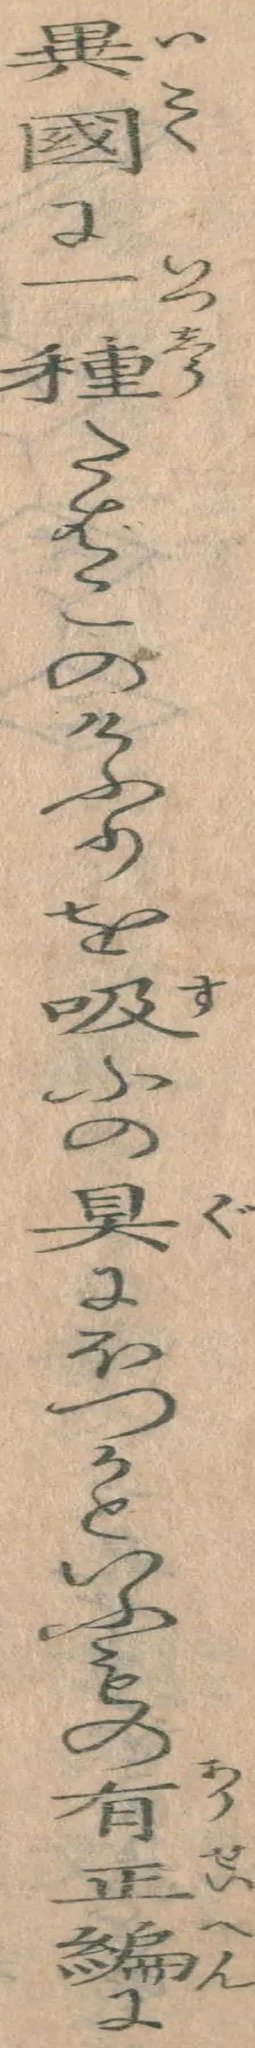異国に一種たばこのけふりを吸ふの具にほつかといふもの有正編に
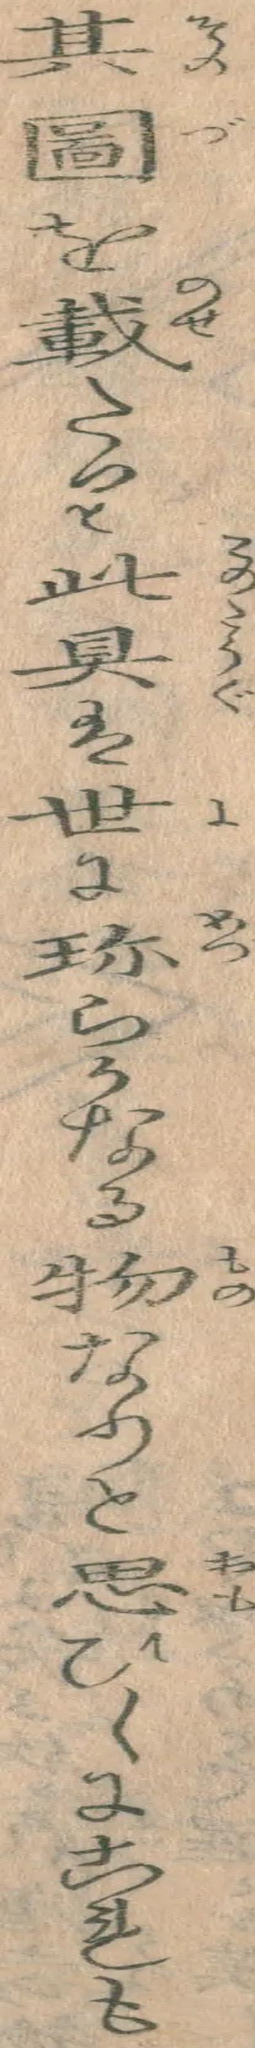其図を載たり此具は世に珍らかなる物なりと思ひしにこれも
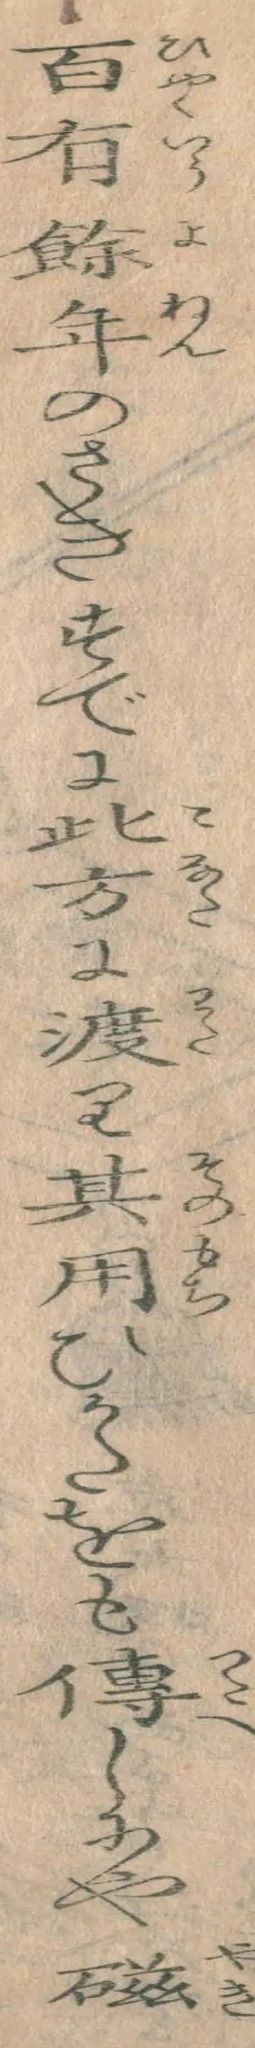百有余年のさきすでに此方に渡り其用ひかたをも伝しにや磁
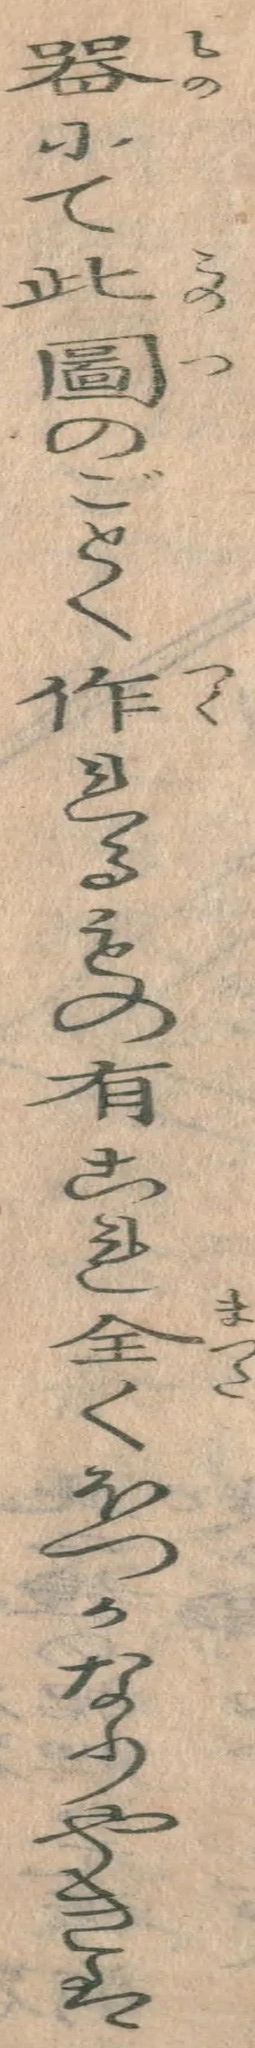器にて此図のごとく作れるもの有これ全くほつかなりやきは
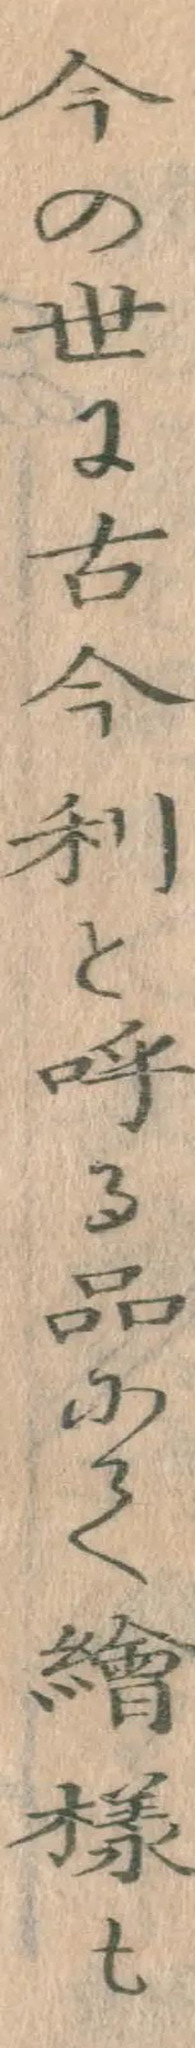今の世に古今利と呼る品にて絵様も
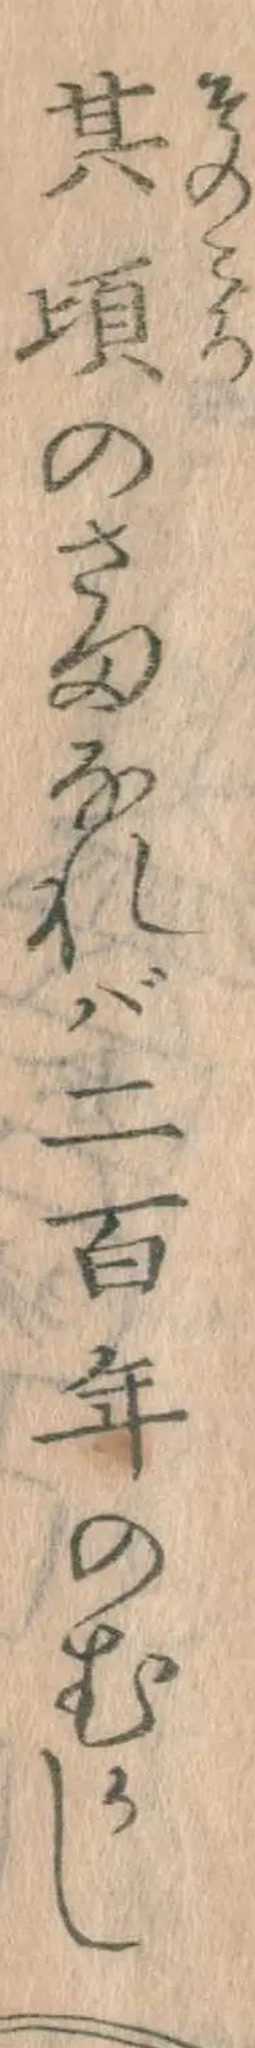其頃のさまなれば二百年のむかし
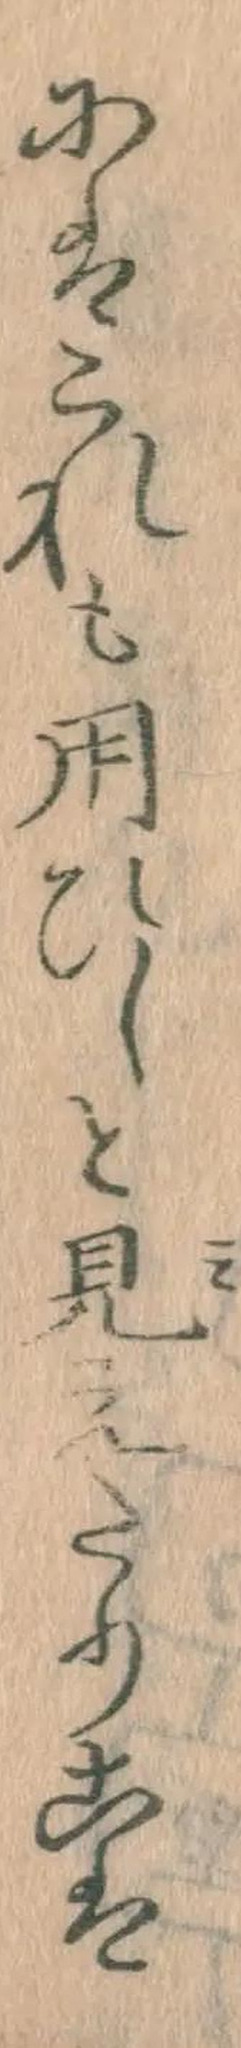にはこれも用ひしと見えたりこは
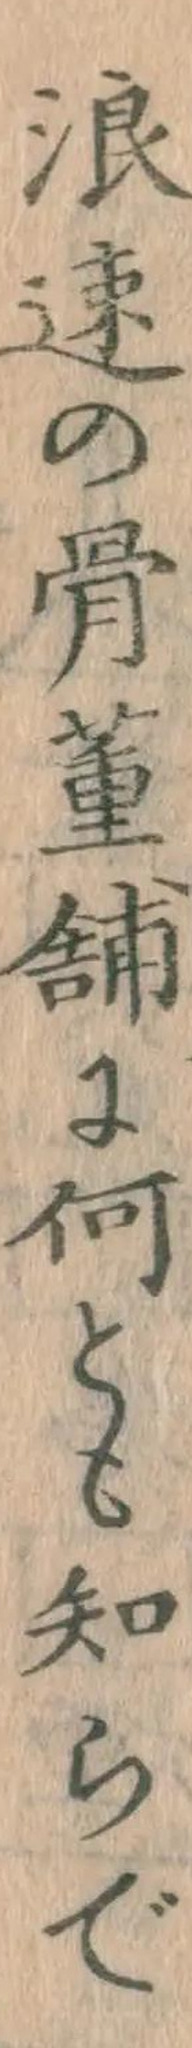浪速の骨董舗に何とも知らで
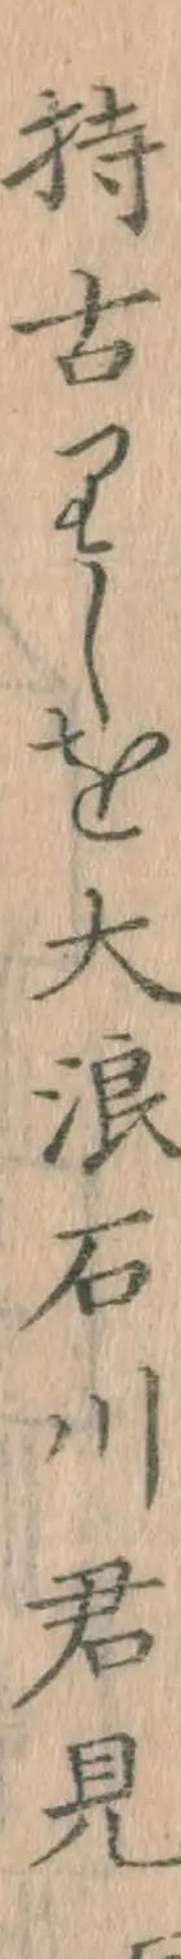持古りしを大浪石川君見
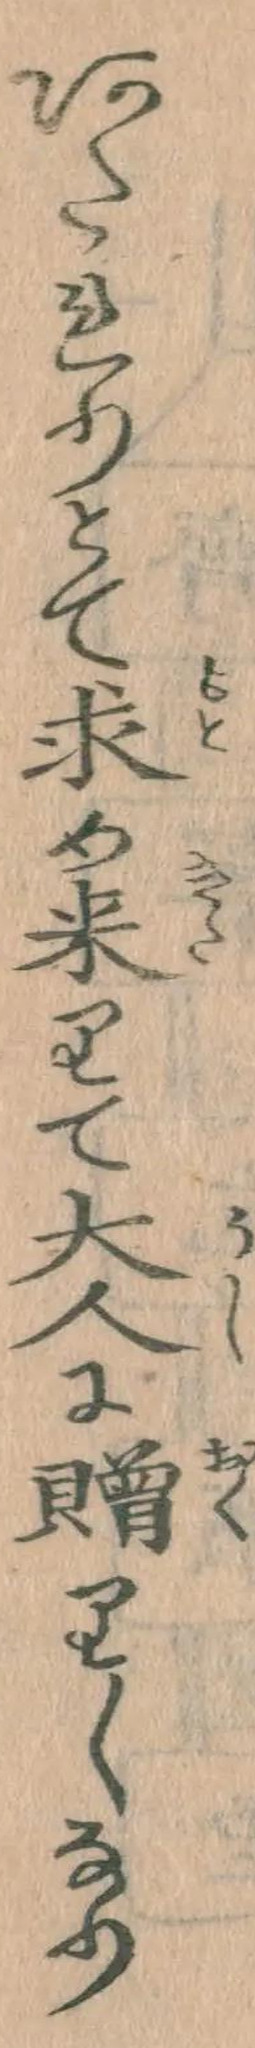あたれりとて求め来りて大人に贈りしなり
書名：目さまし草
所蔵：国立国会図書館 National Diet Library, JAPAN
